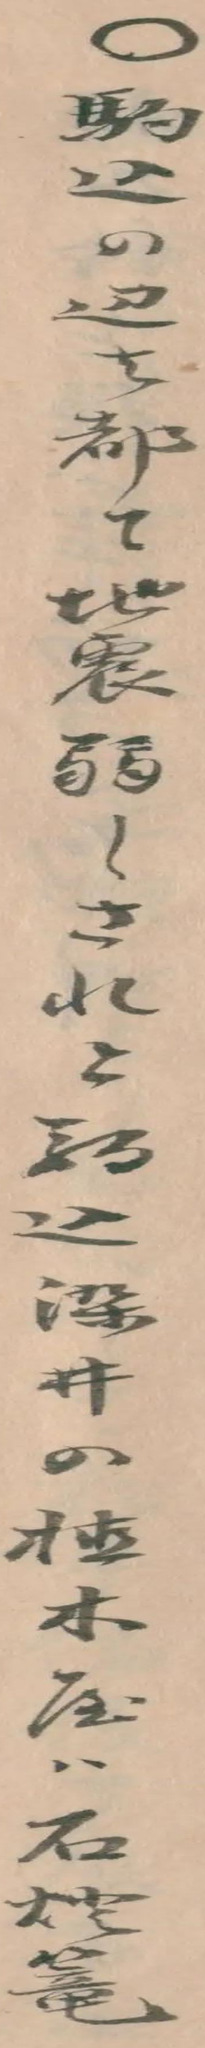〇駒込の辺は都て地震弱しされと駒込染井の植木屋ハ石燈籠

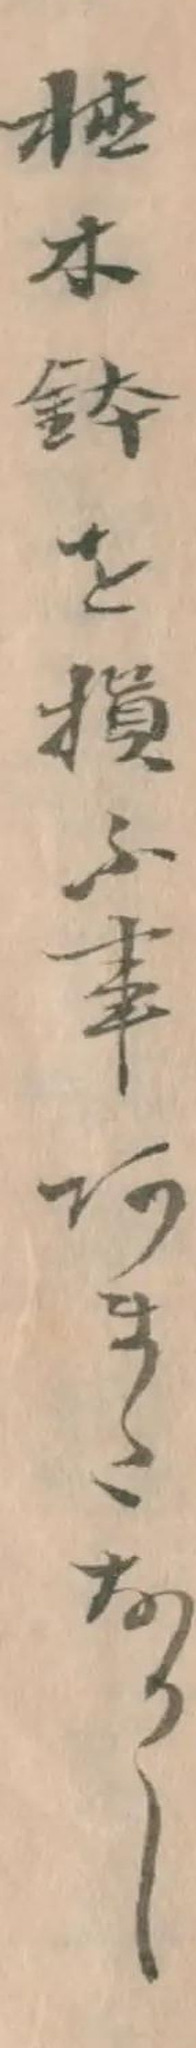植木鉢を損ふ事あまたなりし
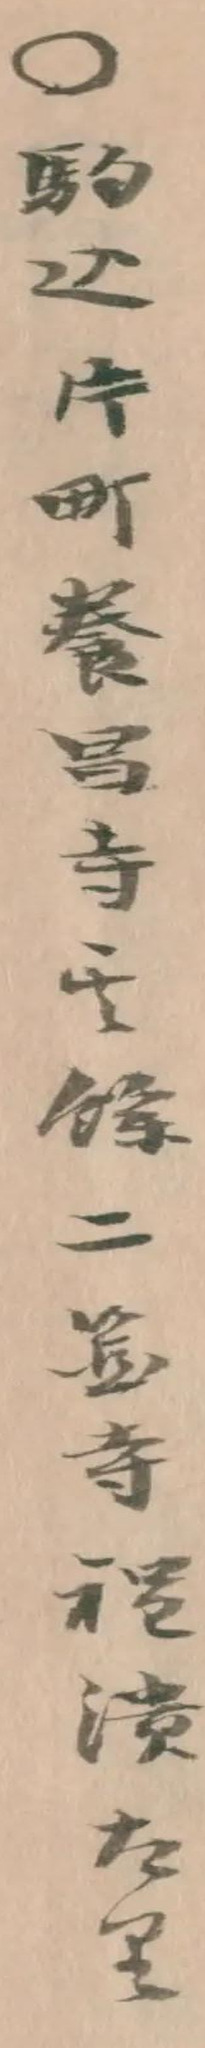〇駒込片町養昌寺其余二箇寺程潰たり
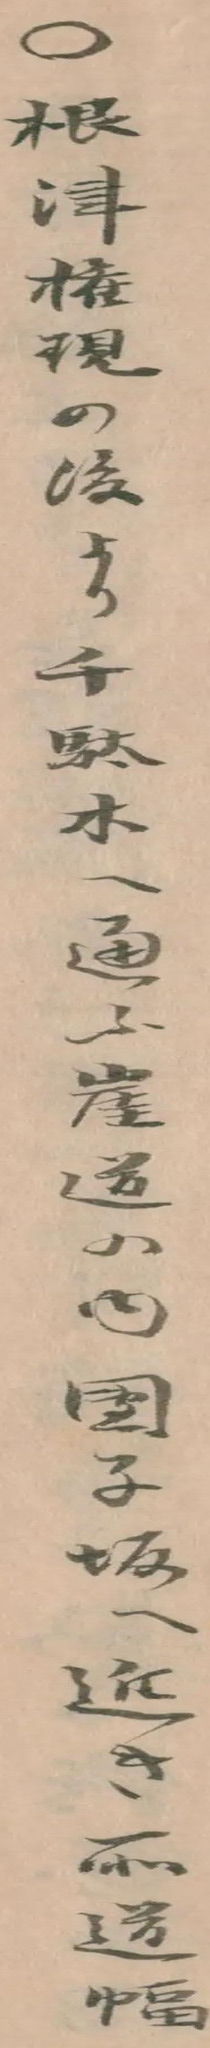〇根津権現の後より千駄木へ通ふ崖道の内団子坂へ近き所道幅
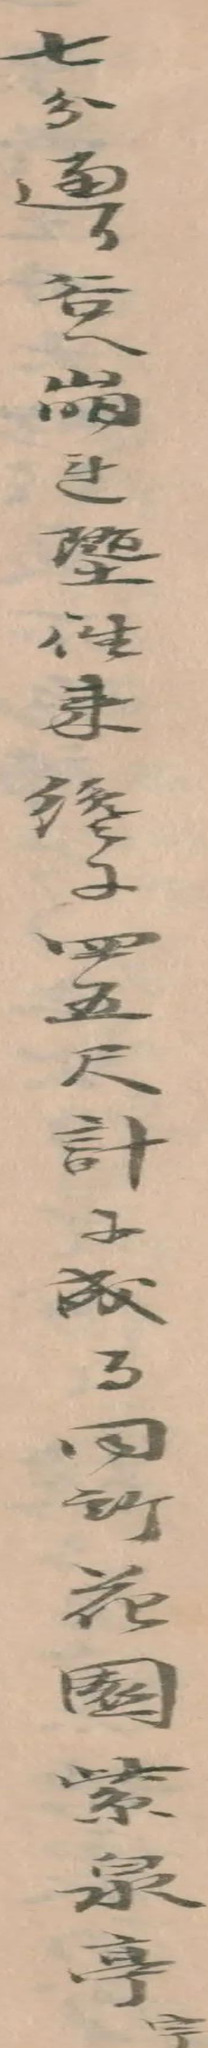七分通り谷へ崩れ墜往来纔に四五尺計に成る同所花園紫泉亭宇
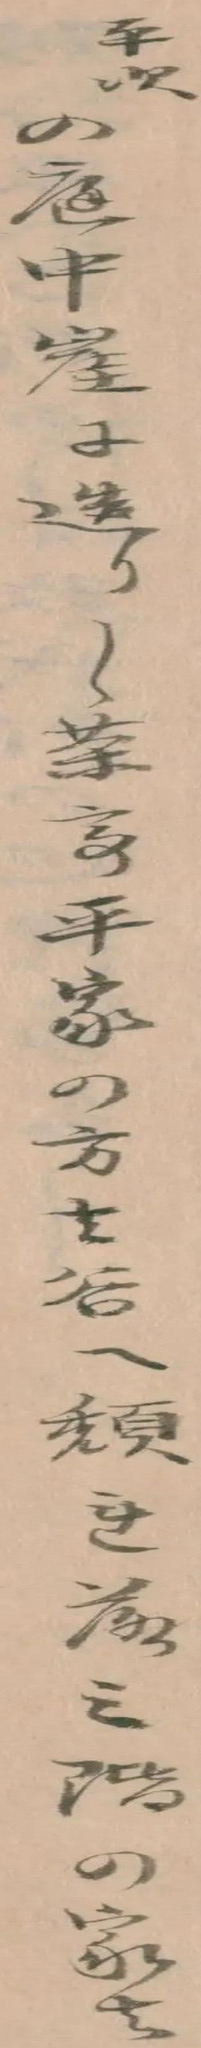平次の庭中崖に造りし茶亭平家の方は谷へ頽れ落三階の家は
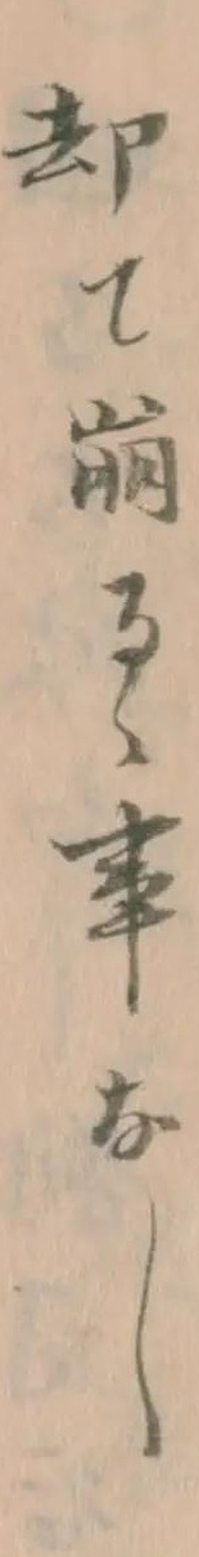却て崩るゝ事なし
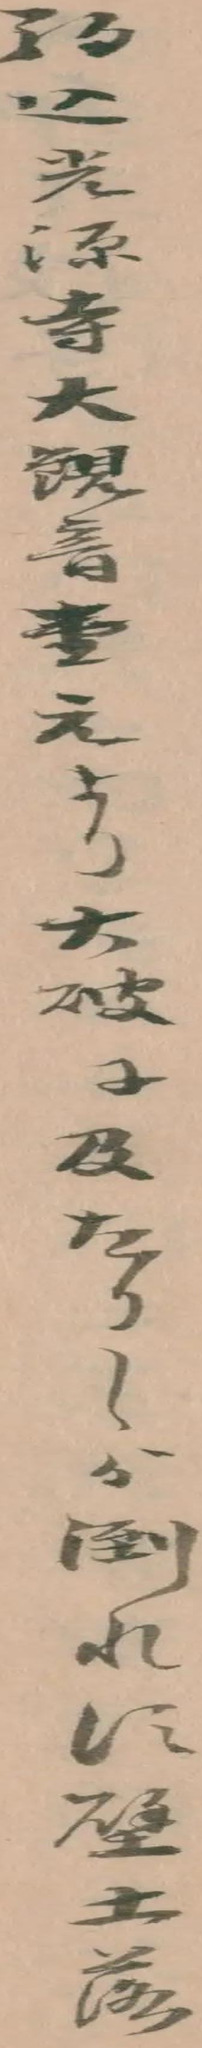駒込光源寺大観音臺元より大破に及たりしか倒れす壁土落
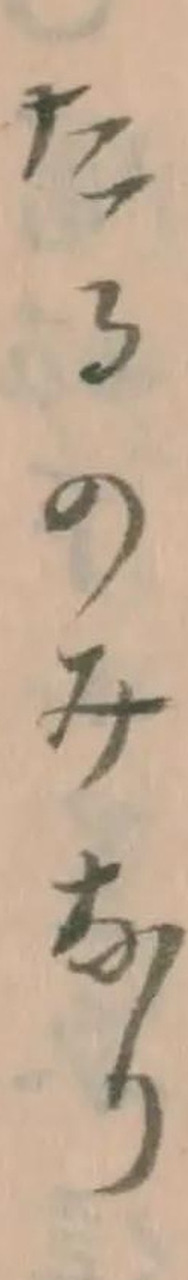たるのみなり
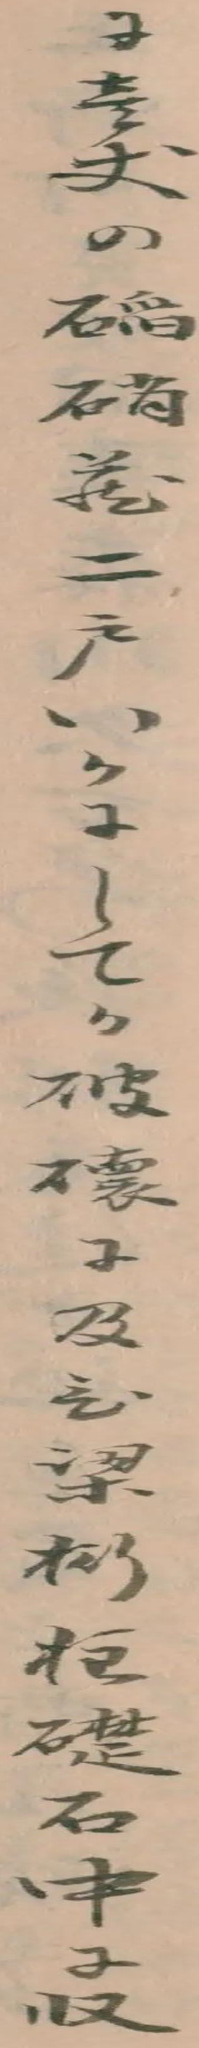に壱丈の焔硝蔵二戸いかにしてか破壊に及ひ梁桁柱礎石中に収
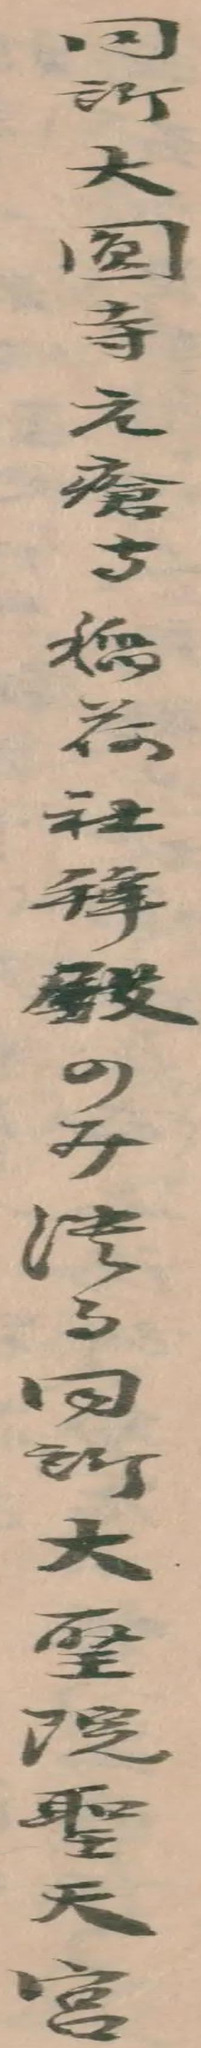同所大圓寺元瘡寺稲荷社拝殿のみ潰る同所大聖院聖天宮
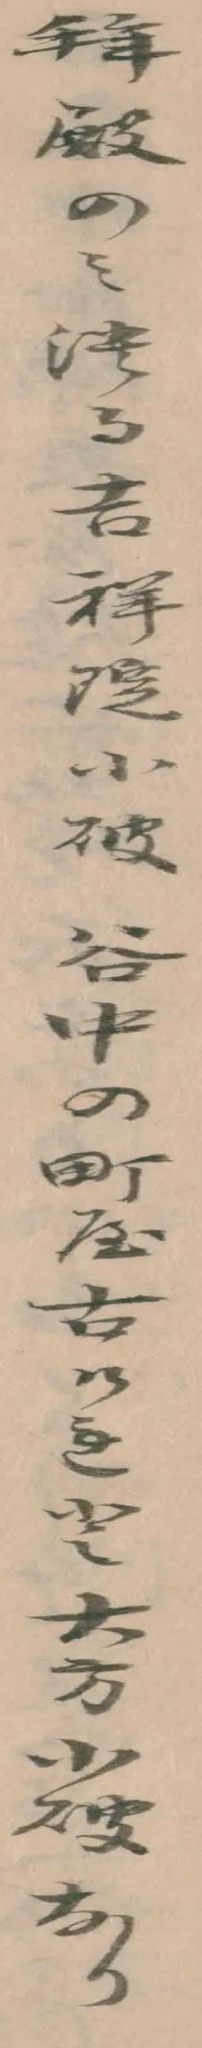拝殿のみ潰る吉祥院小破谷中の町家古けれと大方小破なり
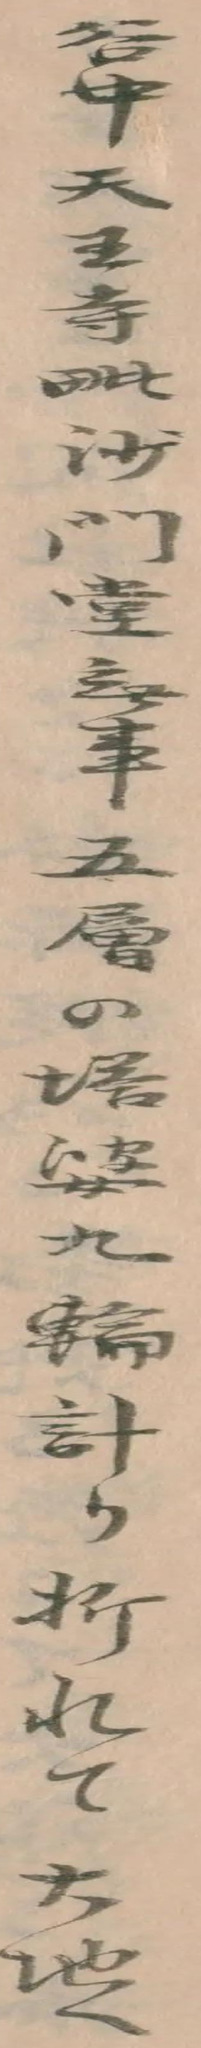谷中天王寺毘沙門堂無事五層の塔婆九輪計り折れて大地へ
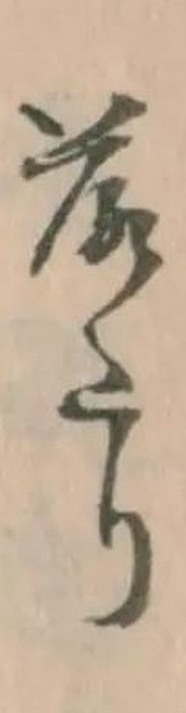落たり
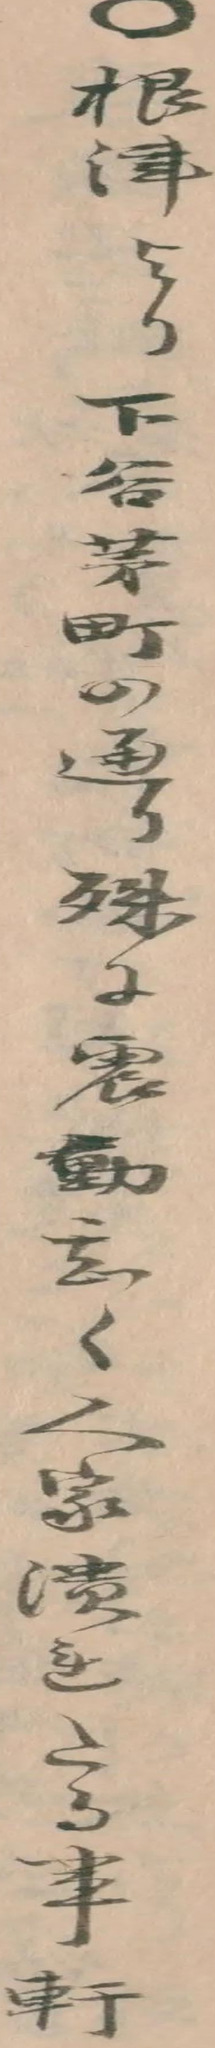〇根津より下谷茅町の通り殊に震動甚く人家潰れたる事軒
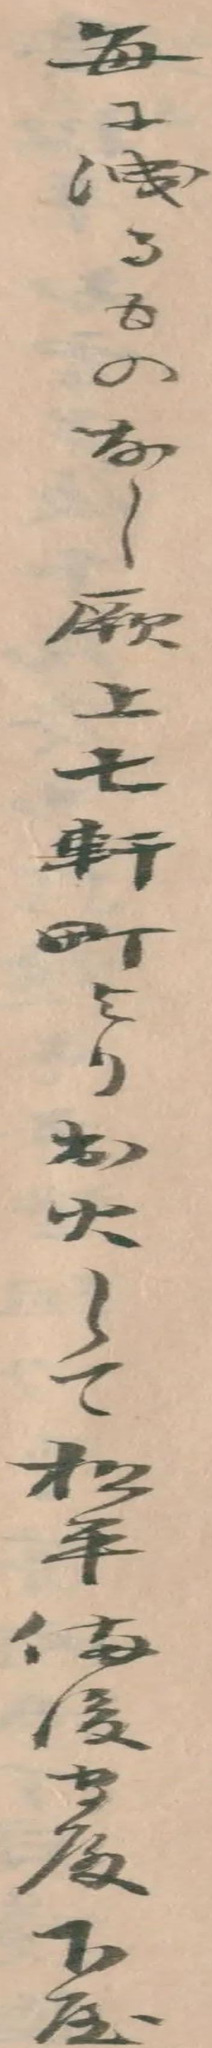毎に洩るものなし厥上七軒町より出火して松平備後守殿下屋
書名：地災撮要. 巻7-9(地震之部)
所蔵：国立国会図書館 National Diet Library, JAPAN
